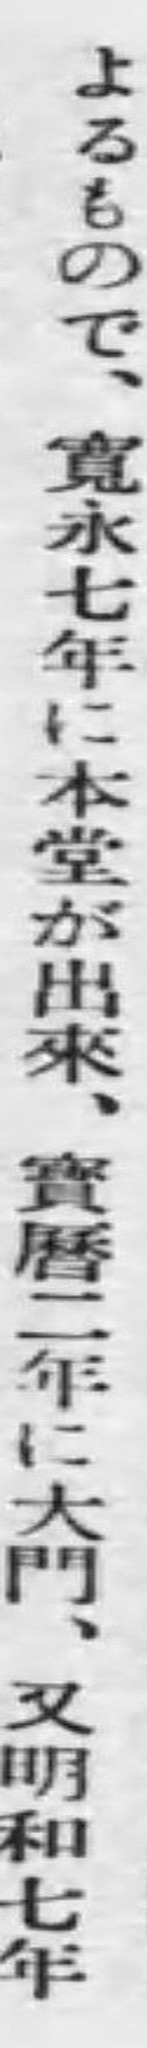よるもので、寛永七年に本堂が出来、宝暦二年に大門、又明和七年
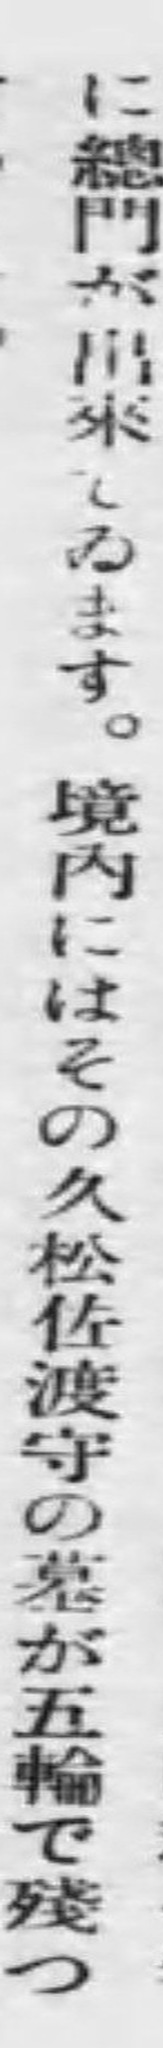に総門が出来てゐます。境内にはその久松佐渡守の墓が五輪で残つ
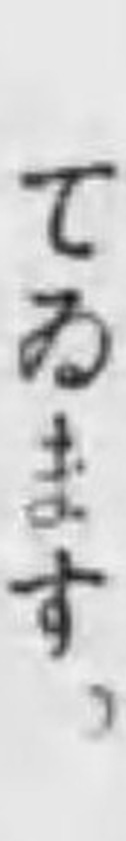てゐます。
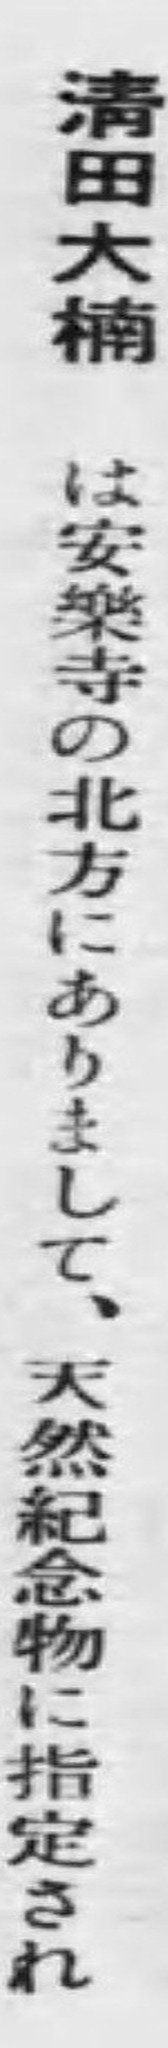清田大楠は安楽寺の北方にありまして、天然紀念物に指定され
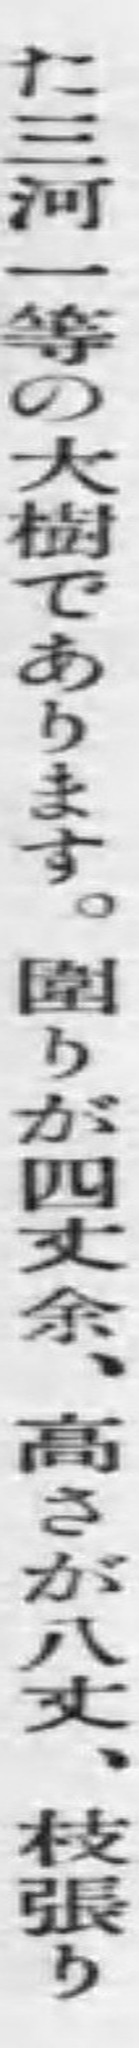た三河一等の大樹であります。囲りが四丈余、高さが八丈、枝張り
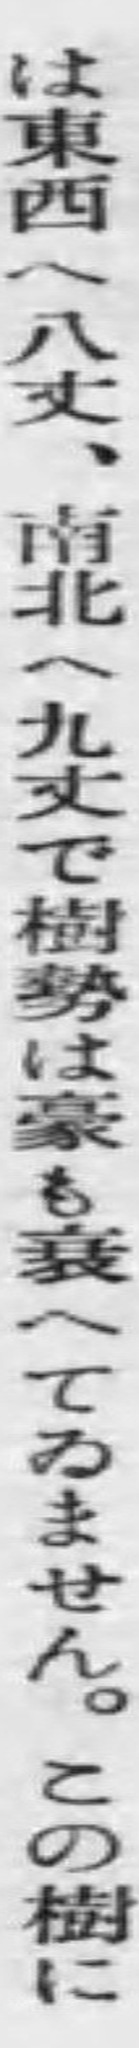は東西へ八丈、南北へ九丈で樹勢は豪も衰へてゐません。この樹に
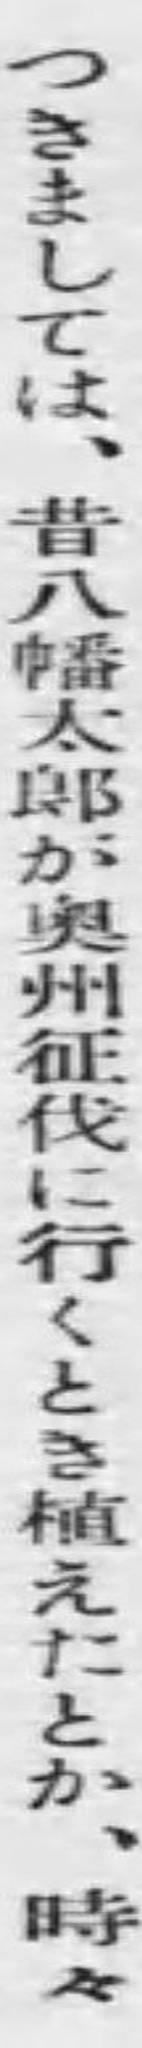つきましては、昔八幡太郎が奥州征伐に行くとき植えたとか、時々
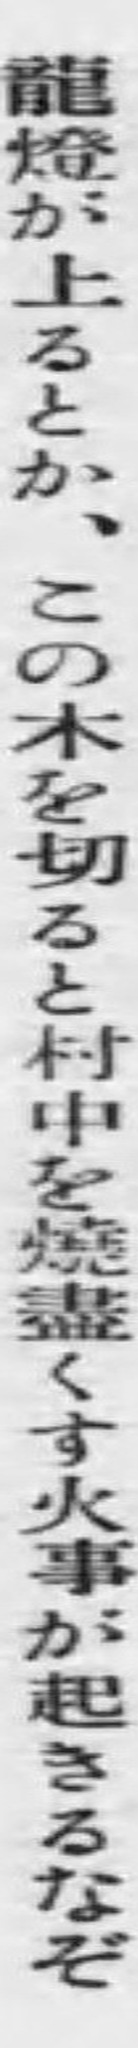龍灯が上るとか、この木を切ると村中を焼尽くす火事が起きるなぞ
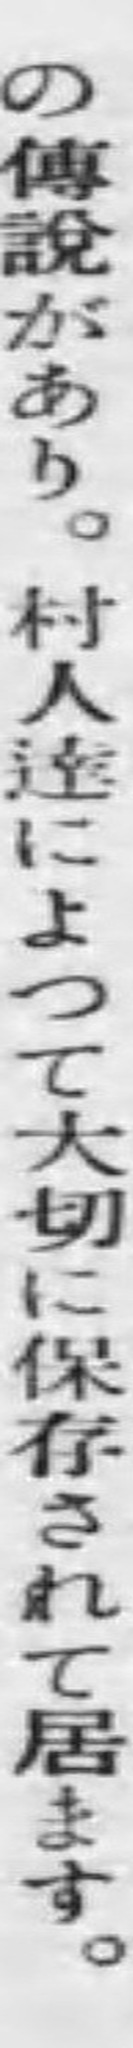の伝説があり。村人達によつて大切に保存されて居ます。
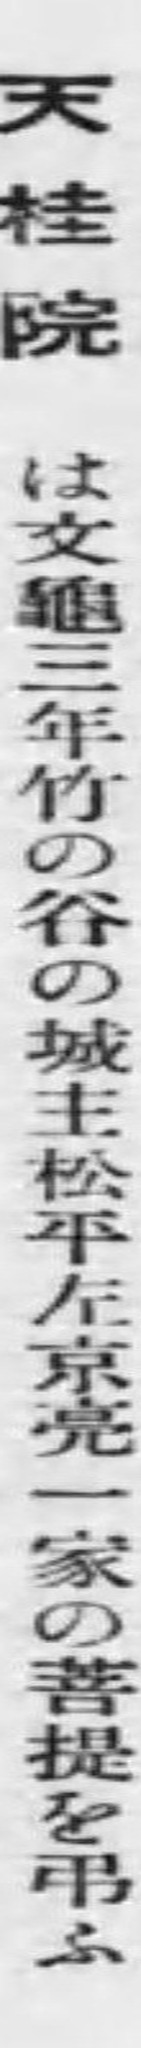天桂院は文亀三年竹の谷の城主松平左京亮一家の菩提を弔ふ
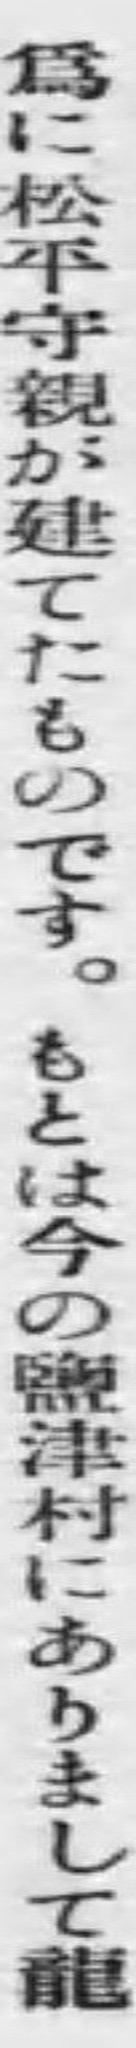為に松平守親が建てたものです。もとは今の塩津村にありまして龍
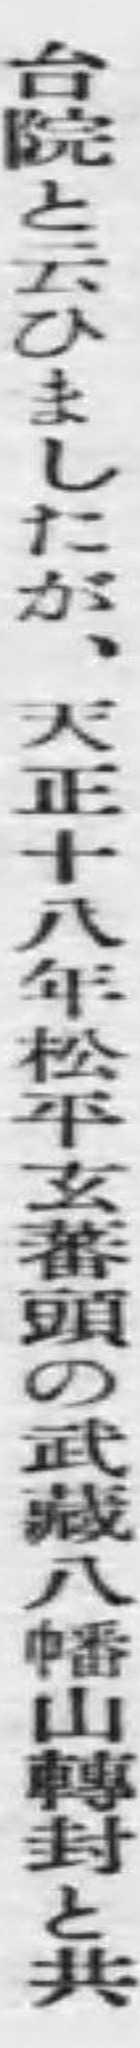台院と云ひましたが、天正十八年松平玄蕃頭の武蔵八幡山転封と共
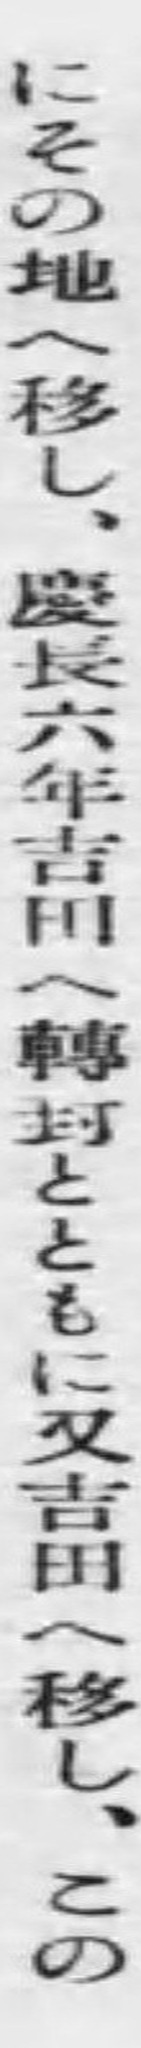にその地へ移し、慶長六年吉田へ転封とともに又吉田へ移し、この
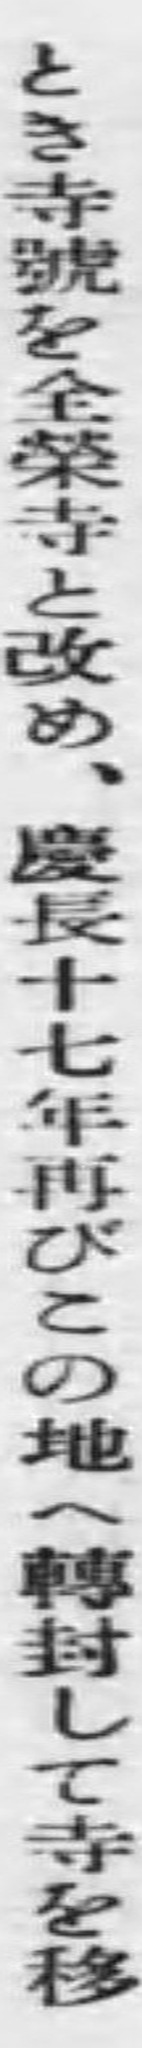とき寺号を全栄寺と改め、慶長十七年再びこの地へ転封して寺を移
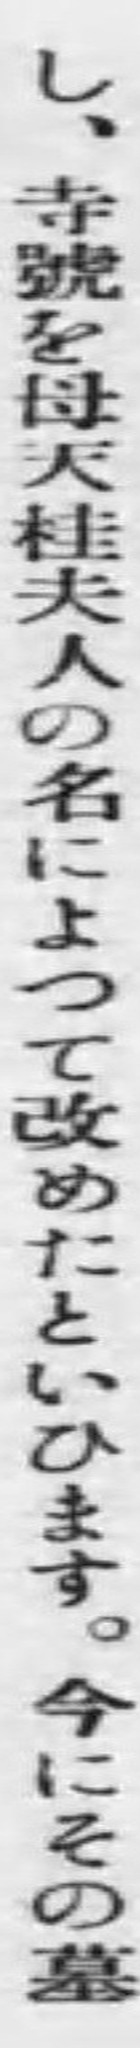し、寺号を母天桂夫人の名によつて改めたといひます。今にその墓
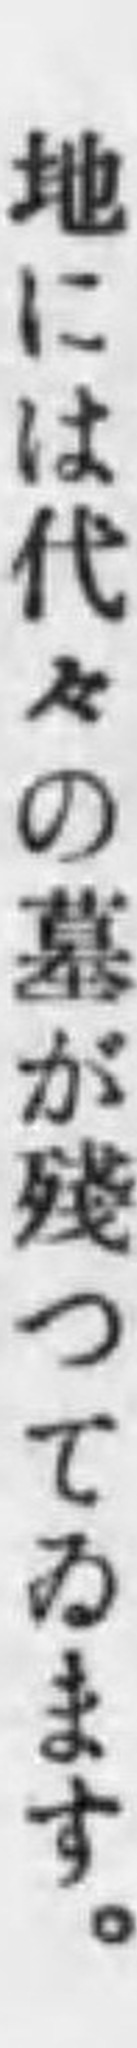地には代々の墓が残つてゐます。
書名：東三河道中記 : 豊橋市及其附近案内
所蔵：国立国会図書館 National Diet Library, JAPAN
